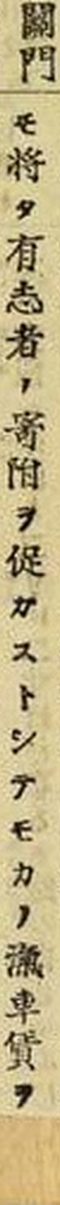モ将タ有志者ノ寄附ヲ促ガストシテモカノ滊車賃ヲ
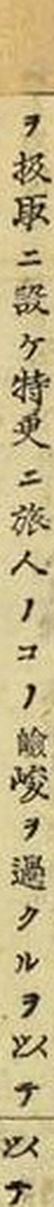ヲ取扱ニ設ケ特更ニ旅人ノコノ嶮峻ヲ過クルヲ以テ
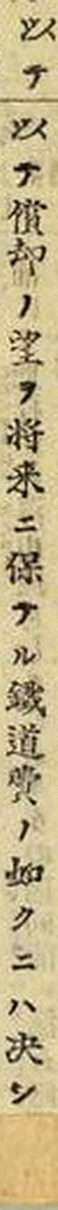以テ償却ノ望ヲ将来ニ保テル鐡道費ノ如クニハ決シ
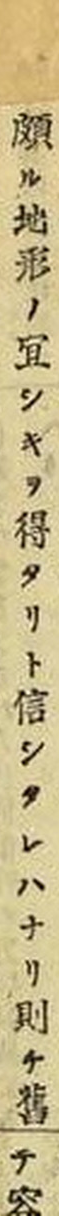頗ル地形ノ冝シキヲ得タリト信シタレハナリ則チ舊
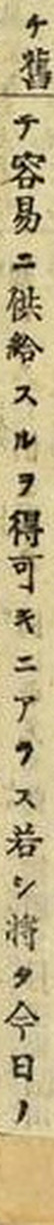テ容易ニ供給スルヲ得可キニアラス若シ将タ今日ノ
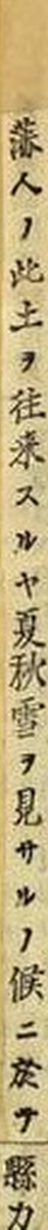藩人ノ此土ヲ往来スルヤ夏秋雪ヲ見サルノ候ニ於テ
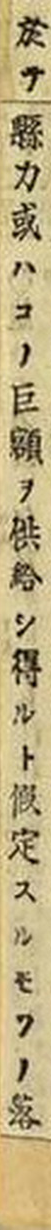縣力或ハコノ巨額ヲ供給シ得ルト假定スルモソノ落
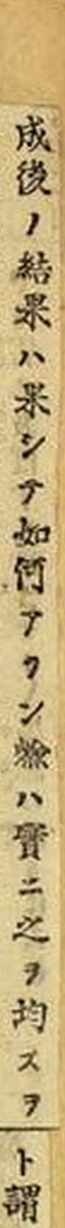成後ノ結果ハ果シテ如何アラン嶮ハ實ニ之ヲ均スヲ
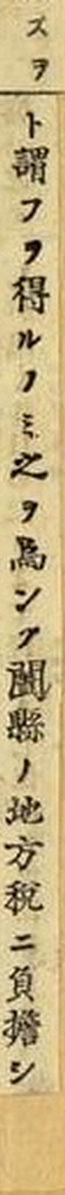ト謂フヲ得ルノミ之ヲ焉ンゾ聞縣ノ地方税ニ負擔シ
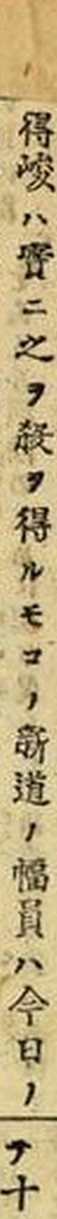得峻ハ實ニ之ヲ殺ヲ得ルモコノ新道ノ幅員ハ今日ノ
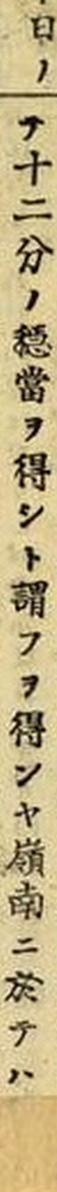テ十二分ノ穏當ヲ得シト謂フヲ得ンヤ嶺南ニ於テハ
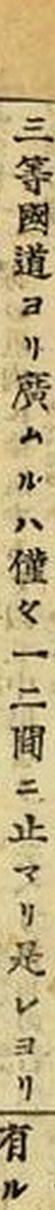三等國道ヨリ廣ムルハ僅々一二間ニ止マリ是レヨリ
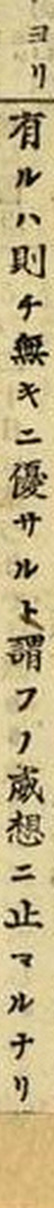有ルハ則チ無キニ優サルト謂フノ感想ニ止マルナリ
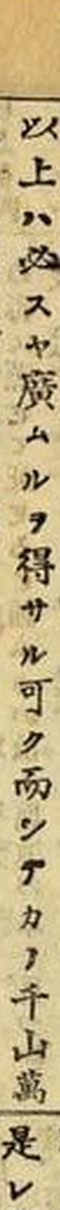以上ハ必スヤ廣ムルヲ得サル可ク而シテカノ千山萬
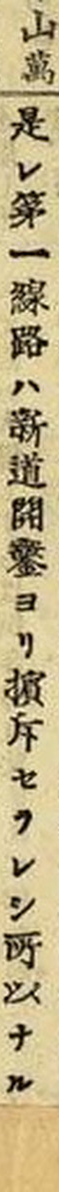是レ第一線路ハ新道開鑿ヨリ擯斥セラレシ所以ナル
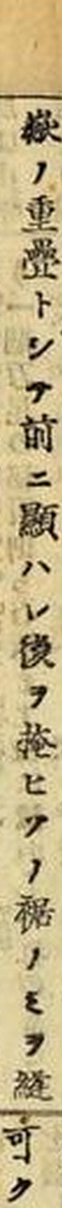嶽ノ重疊トシテ前ニ顕ハレ後ヲ掩ヒソノ裾ノミヲ縫
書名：温古集 五巻
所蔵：福井県文書館 Fukui Prefectural Archives
